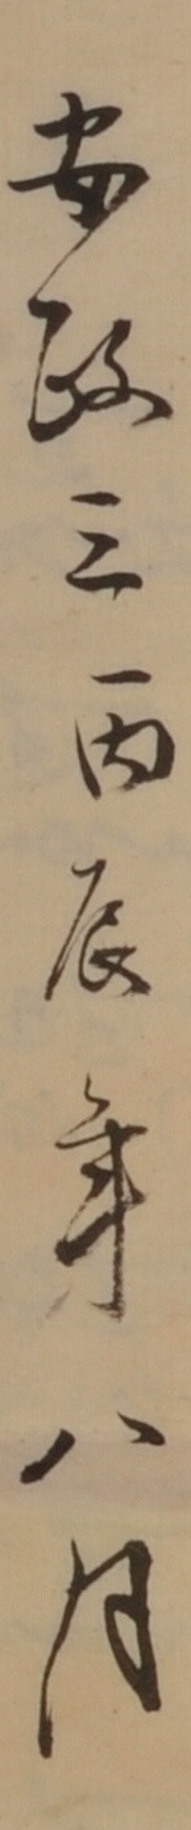安政三丙辰年八月
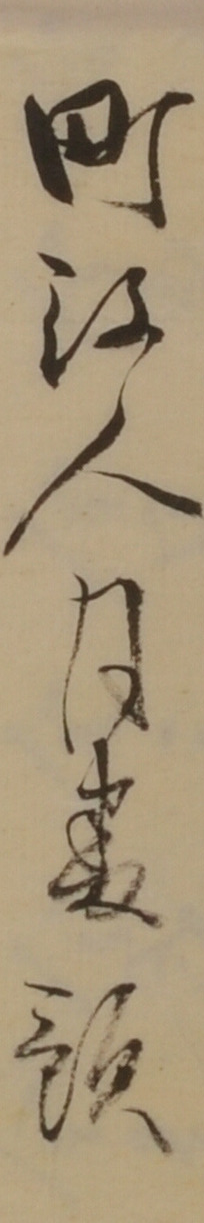町役人月番預

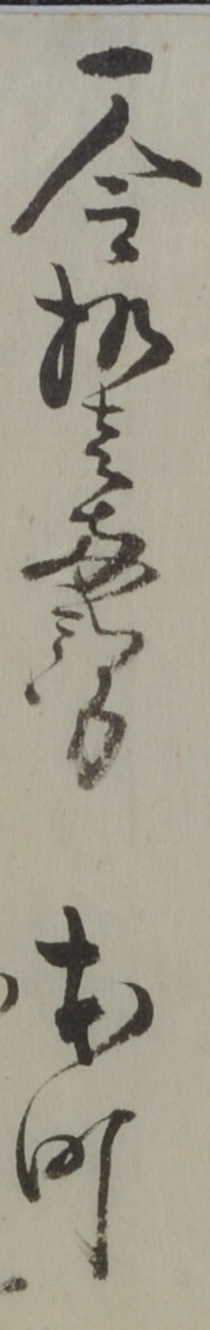一金拾壱両弐分本町
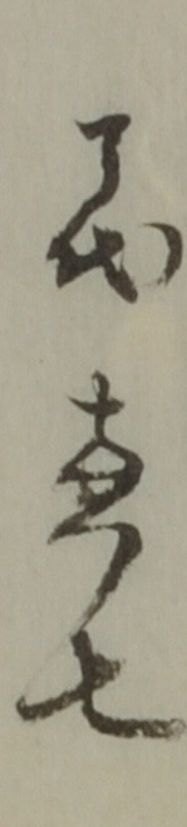丁代恵七
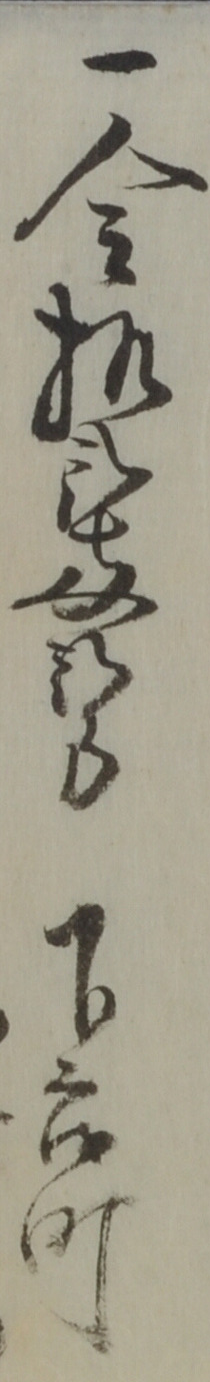一金拾弐両弐分下茂町
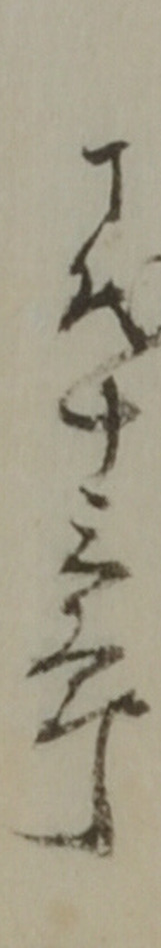丁代十三郎
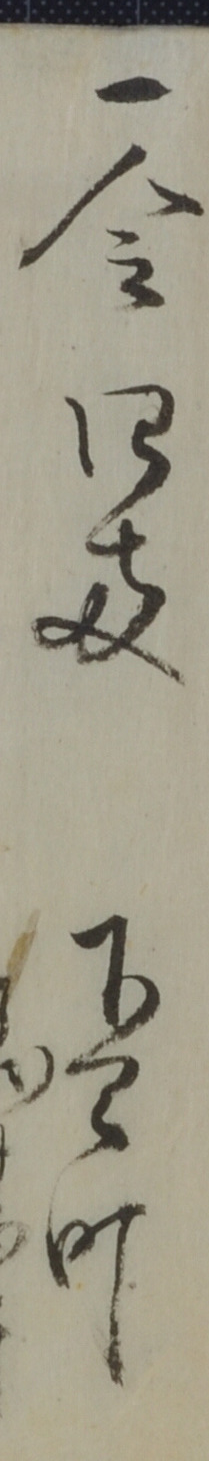一金四両下里町
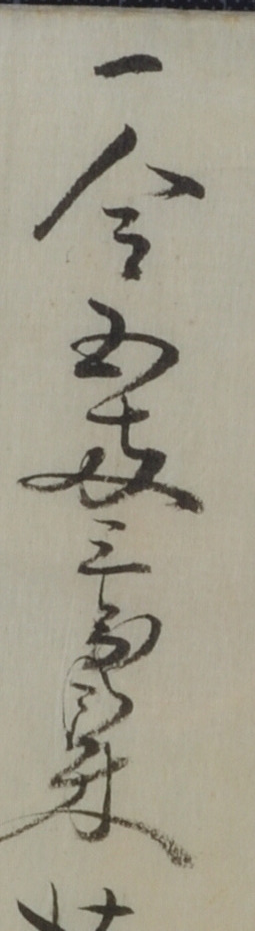一金五両三分弐朱横町
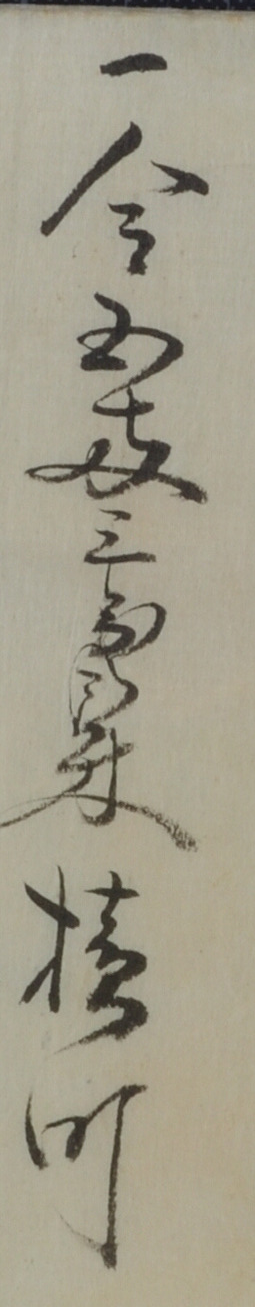一金五両三分弐朱横町
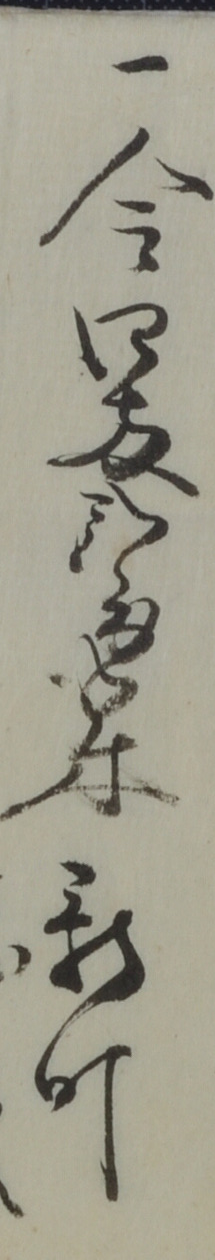一金四両弐分五朱新町
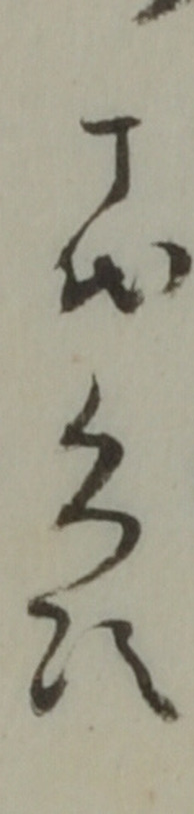丁代久次
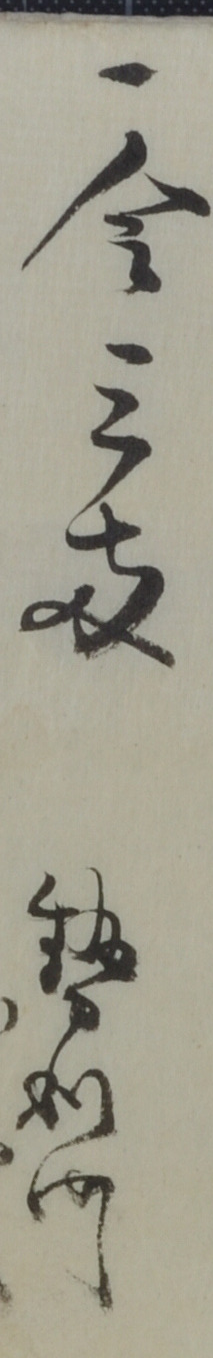一金三両勢利町
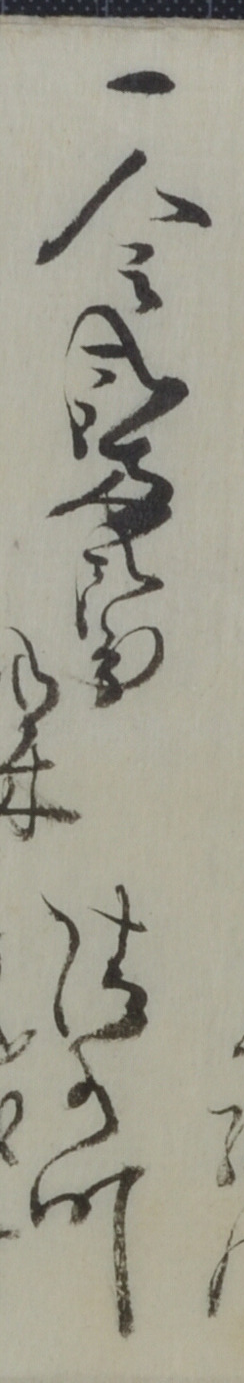一金弐両弐分清水町

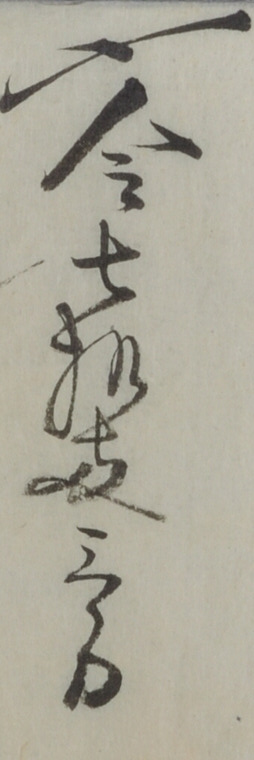〆金七拾両三分

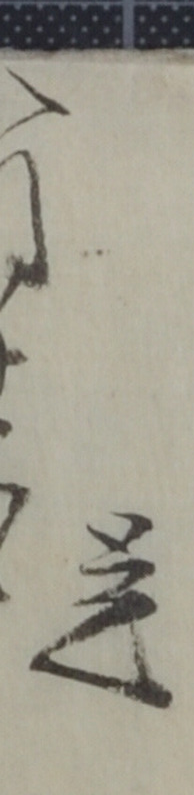八月十三日
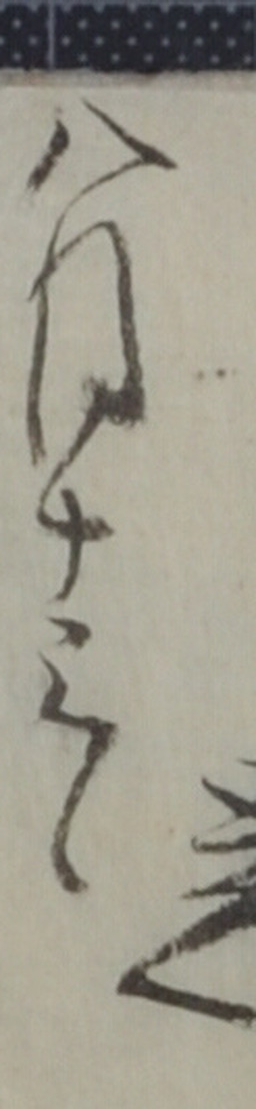八月十三日
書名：江戸御上屋鋪御類焼ニ付拾町より献金取集帳
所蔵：伊那市立高遠町図書館・合同会社AMANE
